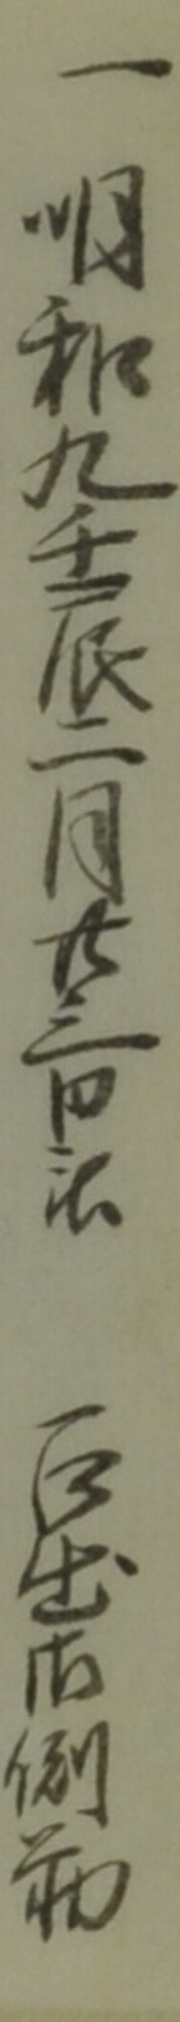一明和九壬辰二月廿三日被召出御側勤
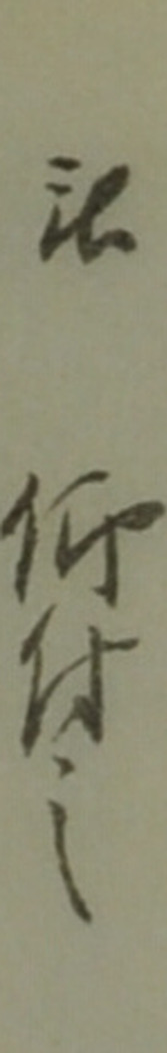被仰付之
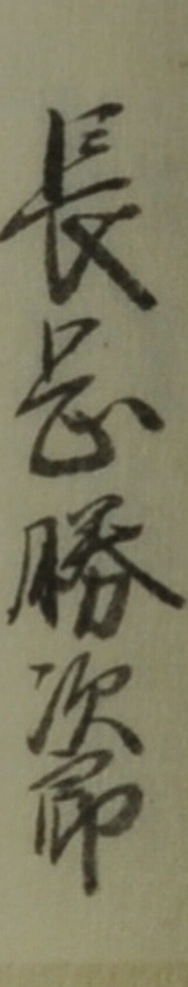長岡勝次郎
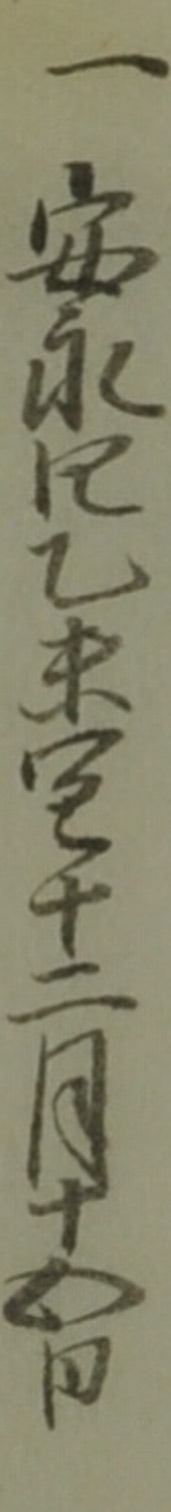一安永四乙未閏十二月十五日
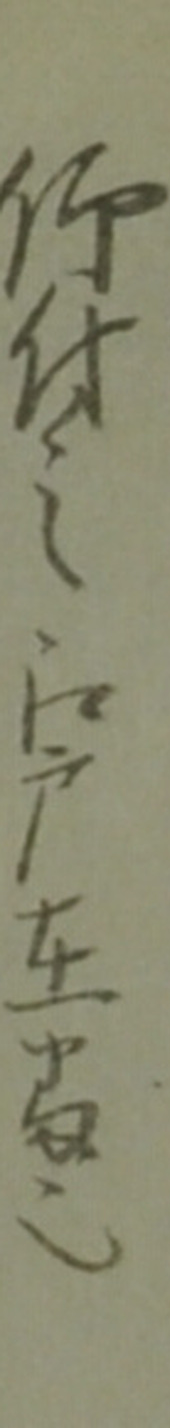仰付之江戸在番也
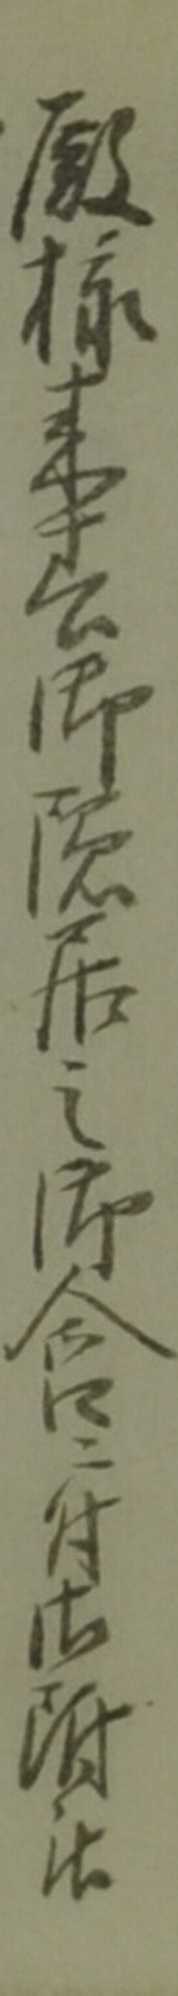殿様来春御隠居之御含ニ付御附被
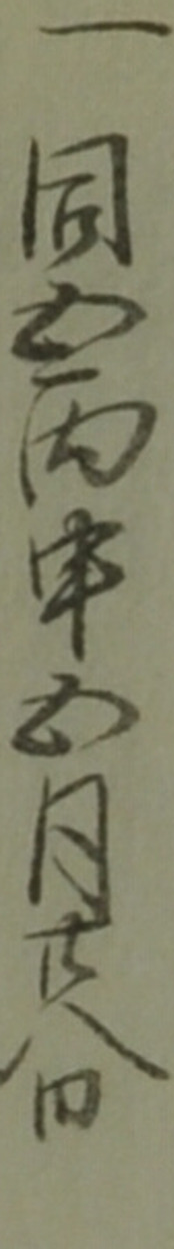一同五丙申五月廿八日
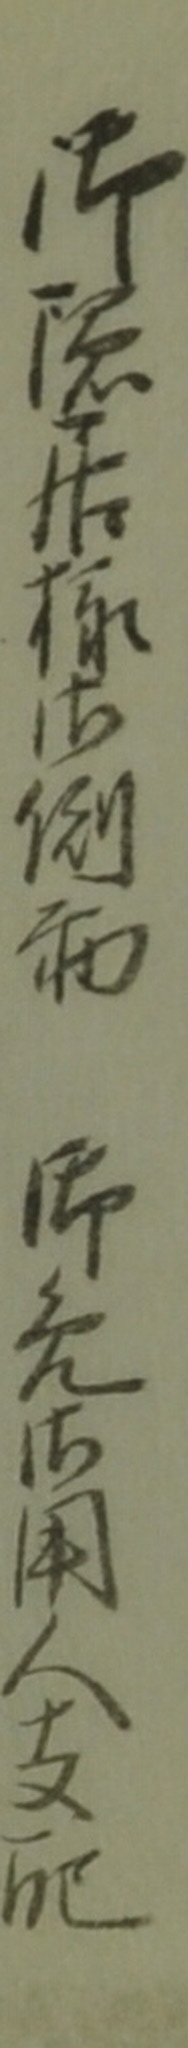御隠居様御側勤御免御用人支配
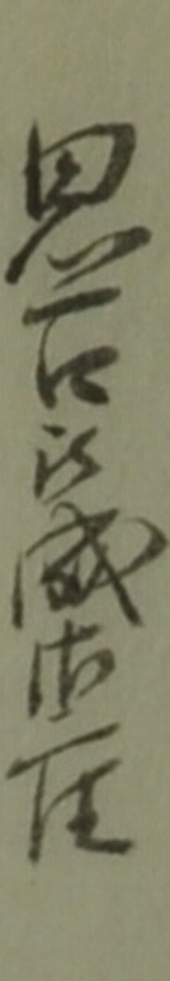思召被成御座
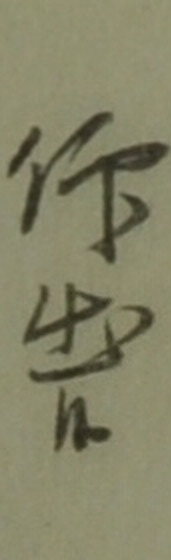仰出候
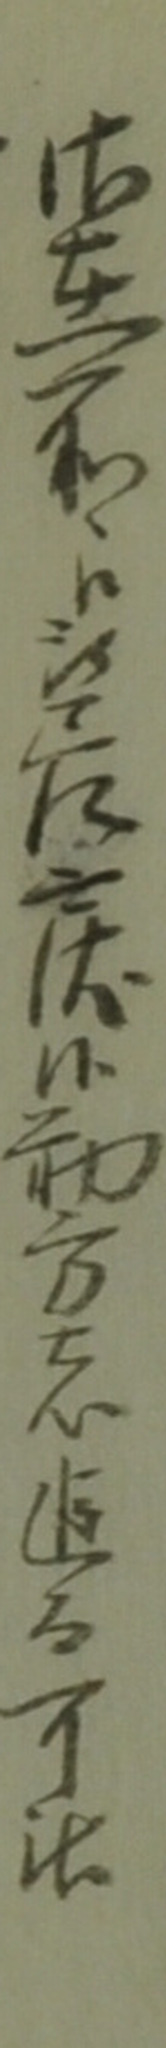御在所江被差戻候勤方者追而可被
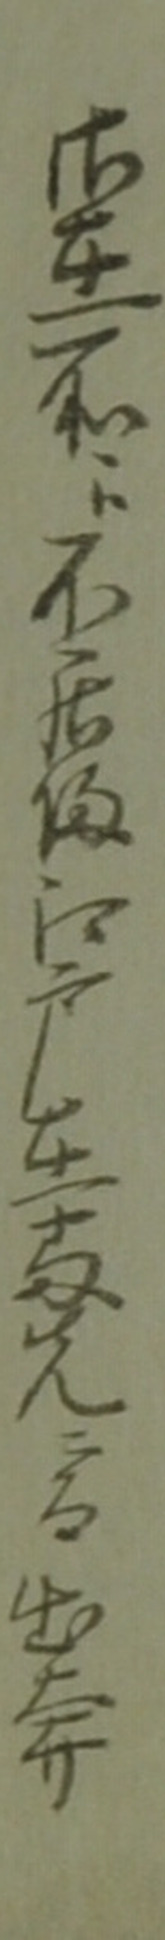御在所江不罷帰江戸在番先ニ而出奔
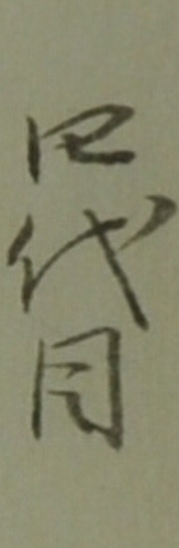四代目
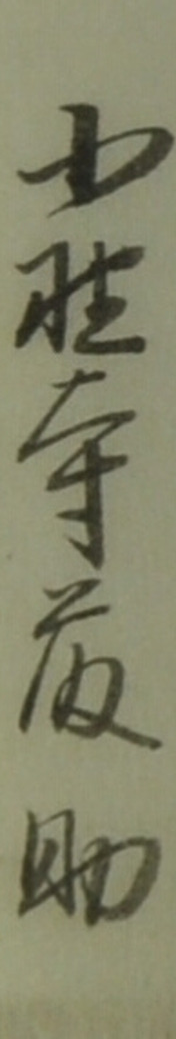小野寺藤助

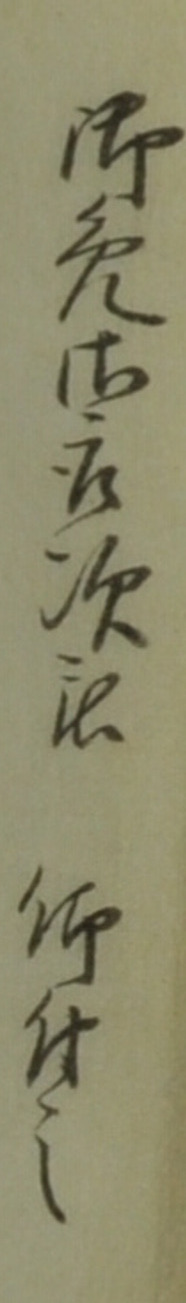御免御取次被仰付之
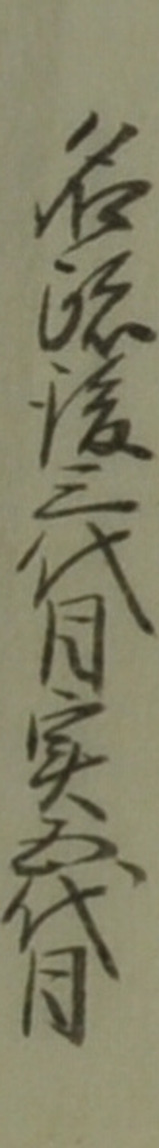名跡後三代目実五代目
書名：諸御役代々録（五）
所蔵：伊那市立高遠町図書館・合同会社AMANE
